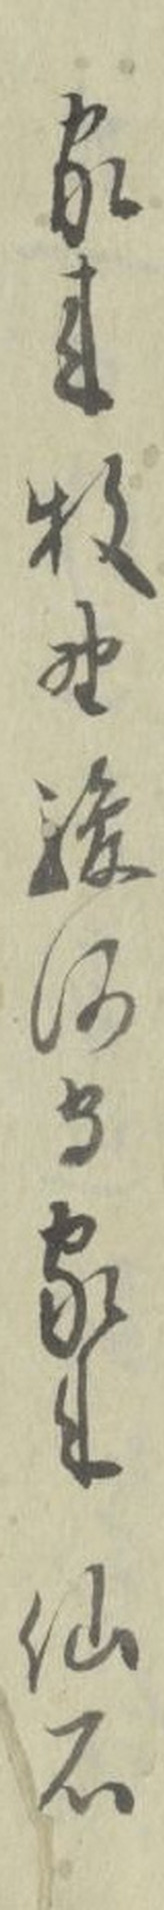家来牧野駿河守家来仙石
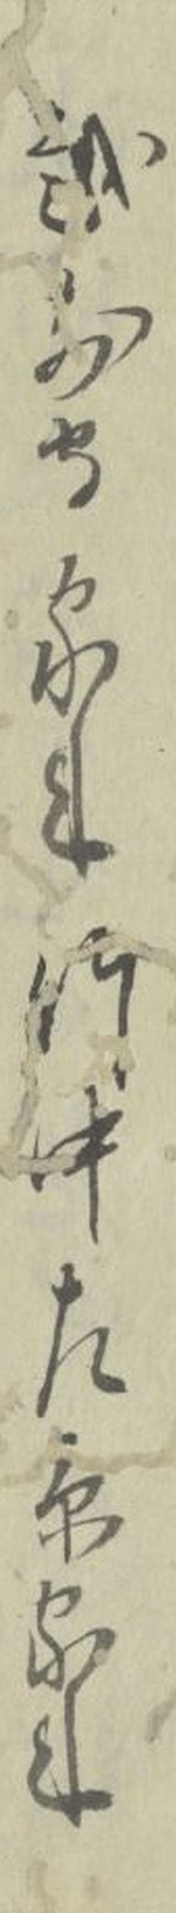越前守家来備中左京家来
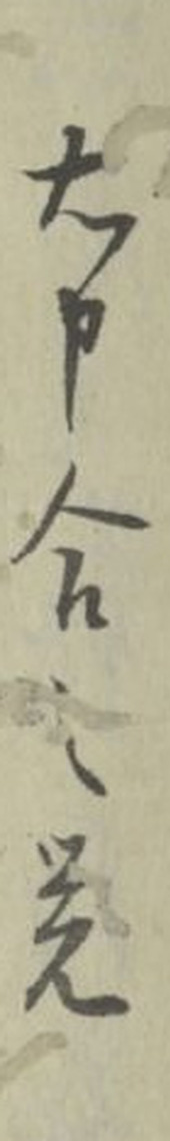右申合之覚
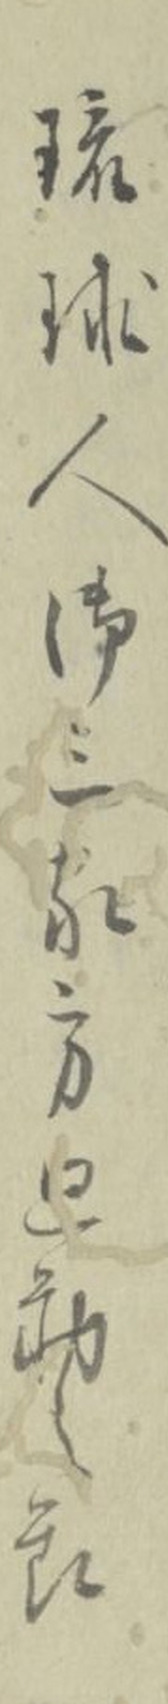琉球人御三家方廻勤之節
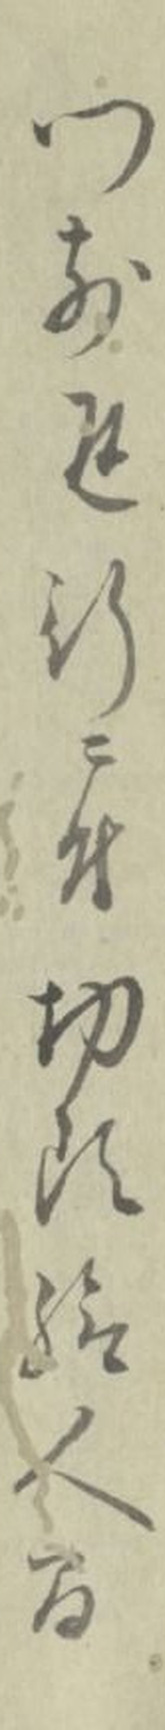門前通行に付物頭給人間
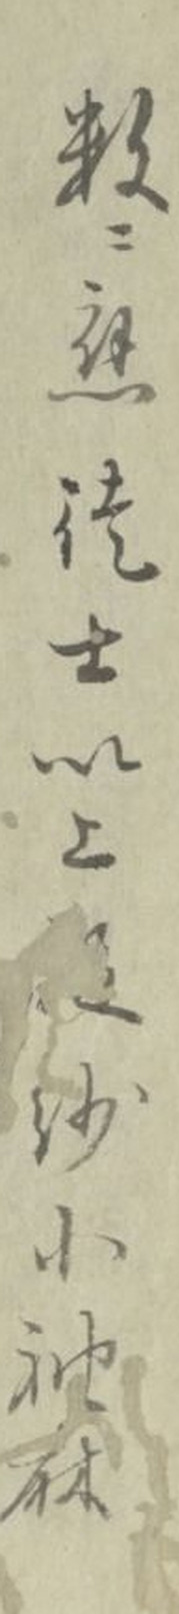数に応徒士以上紗小袖麻
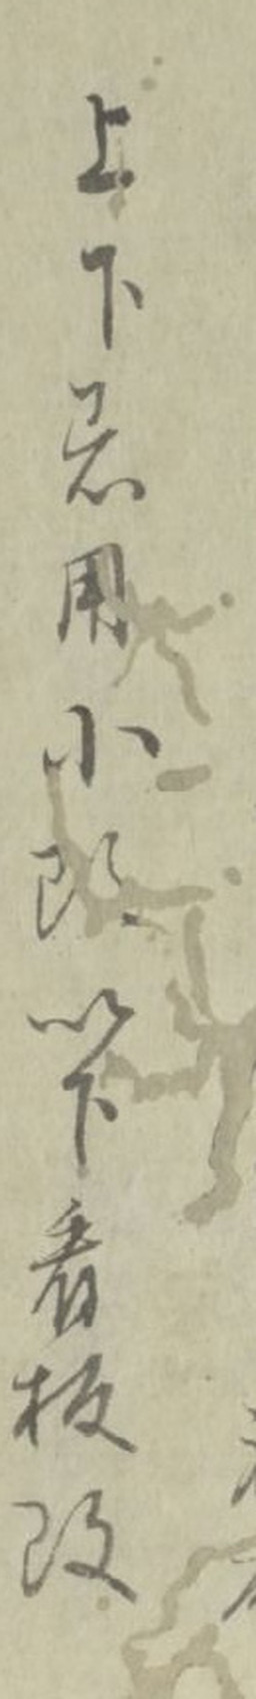上下着用小頭以下看板改
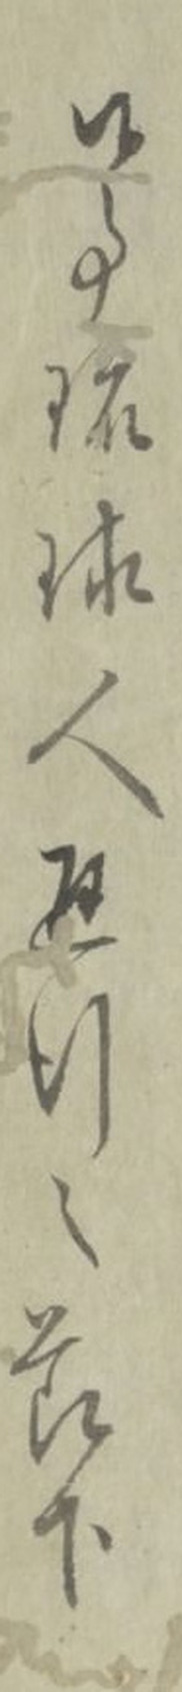候事琉球人通行之節下

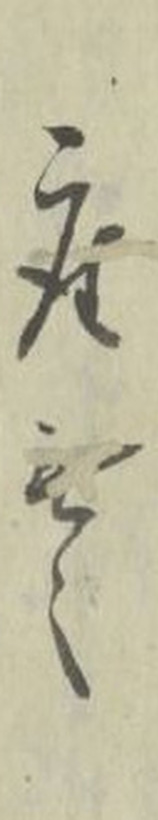座無之
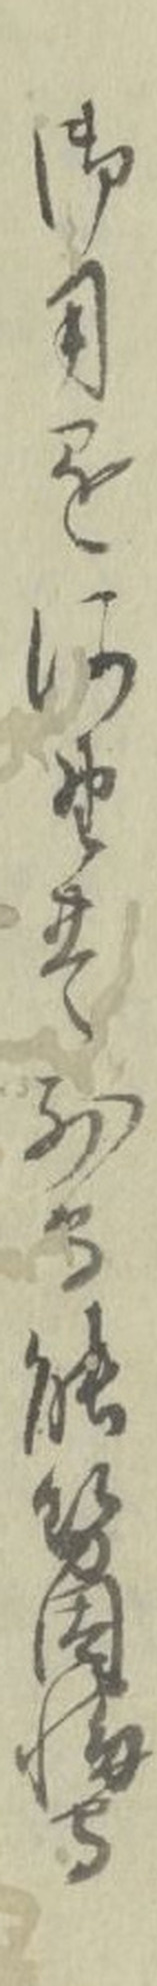御用懸河野豊前守能勢因幡守
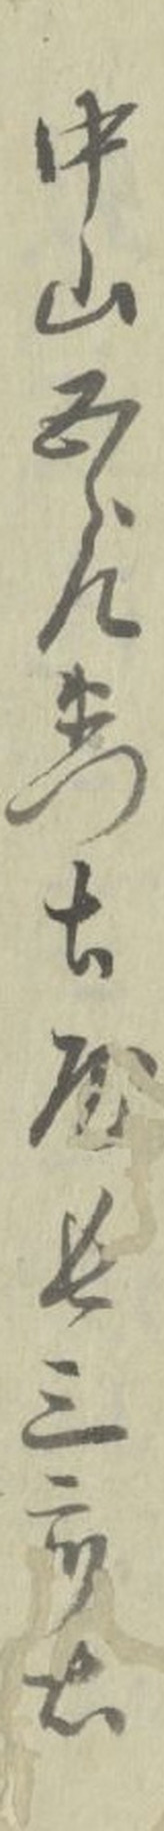中山五郎左衛門古屋長三郎右
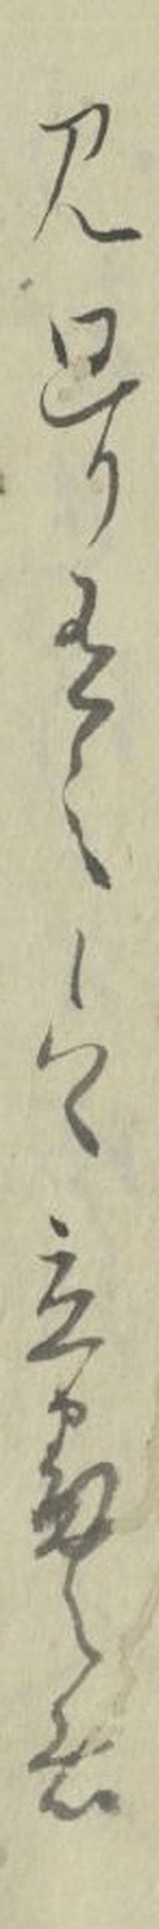見廻り有之候はゝ立番之者
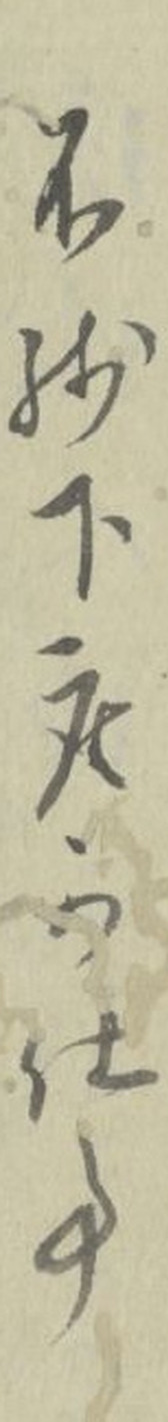不残下座可仕事
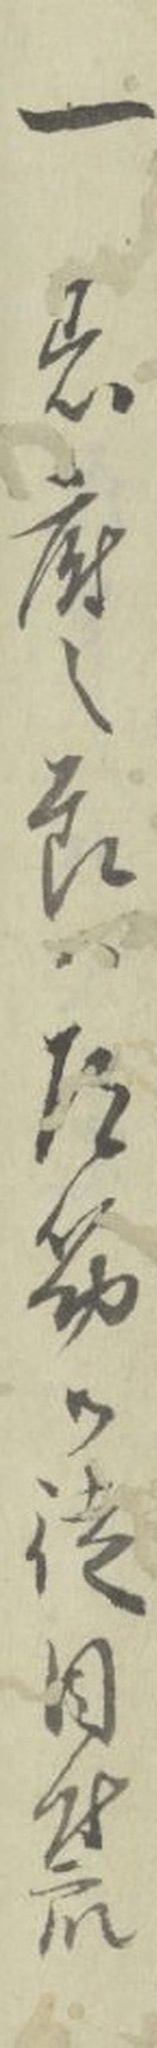一着府之節は道筋御徒目付衆
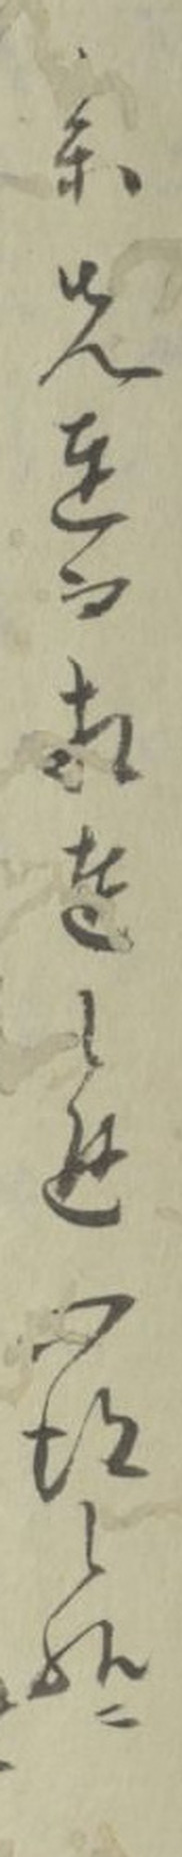参先達而相達候通心得候様にと
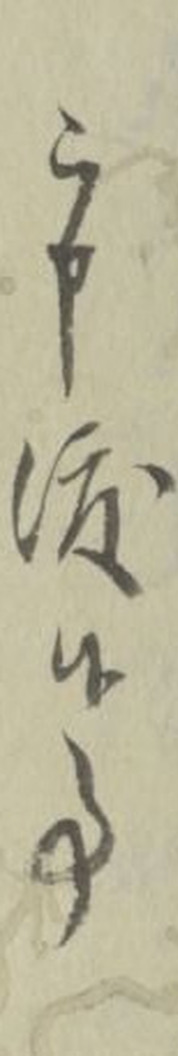被申渡候事
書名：琉球来朝記 自八至十四終
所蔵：University of the Ryukyus Library
